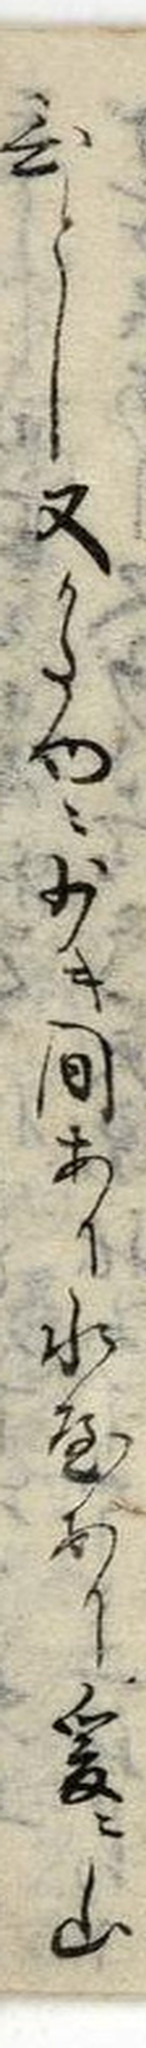とし又かたやニ少き間あり水屋ありに山
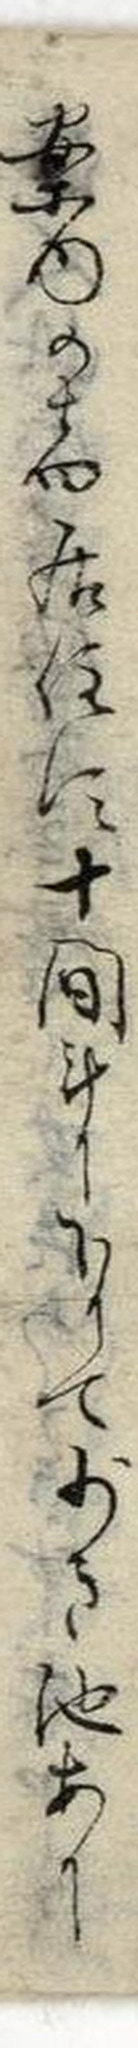案内の者居住十間斗り下りて小き池あり

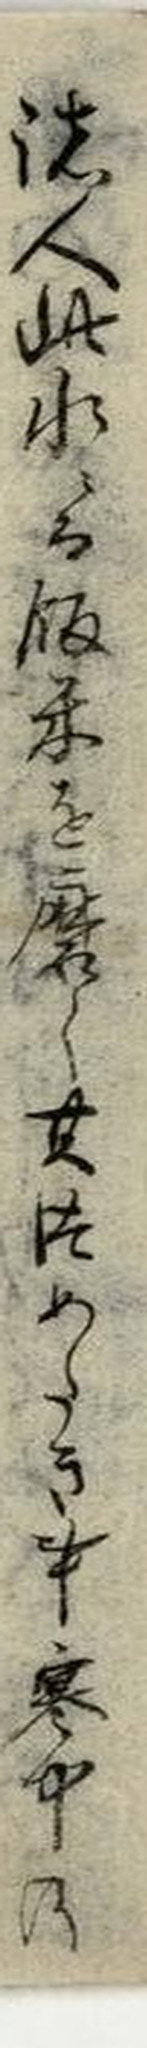諸人此水ニ而飯米を磨く其つめたき事寒中乃
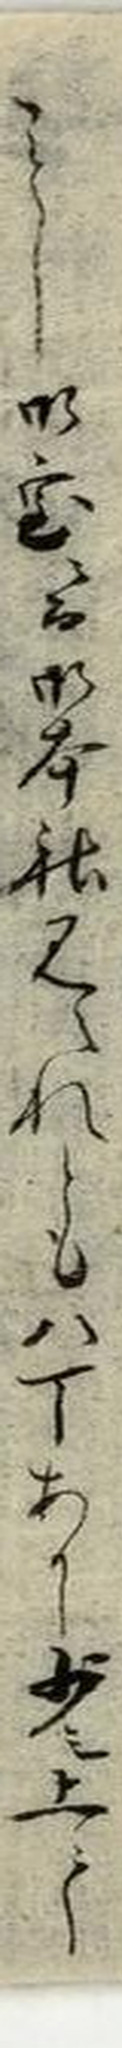ことし御室にて御本體見たれとも八丁あり少シ上に
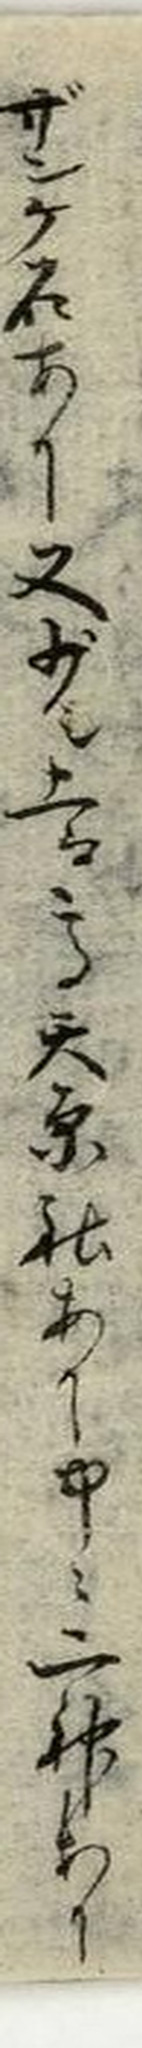ザンゲ石ありまた少し上高天原體あり中ニ二神あり
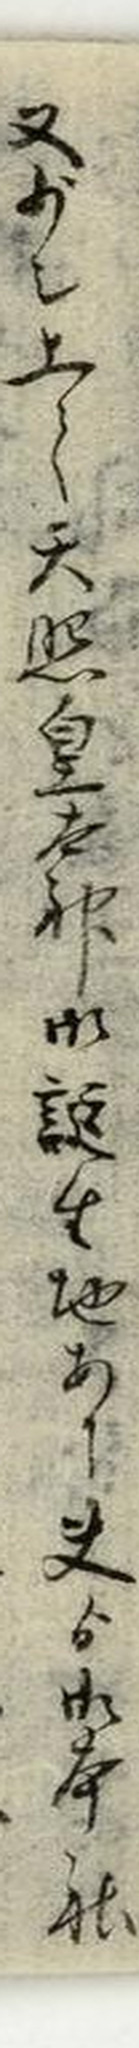又少し上に天照皇御神御誕生地あり其ゟ御本體
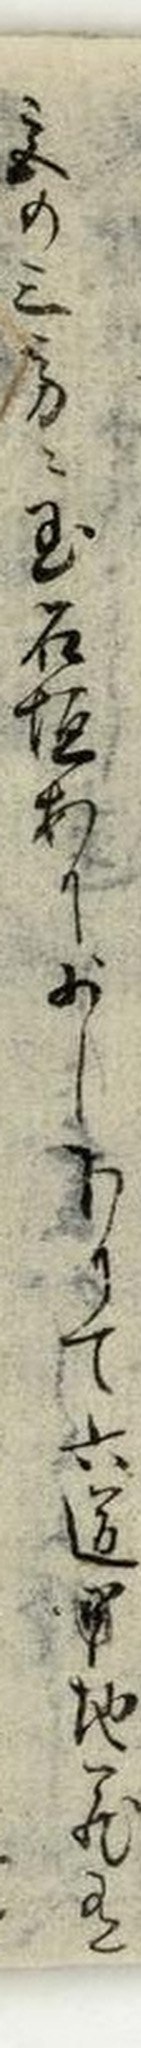宮の三方ニ玉石垣あり少し下りて六道地蔵有
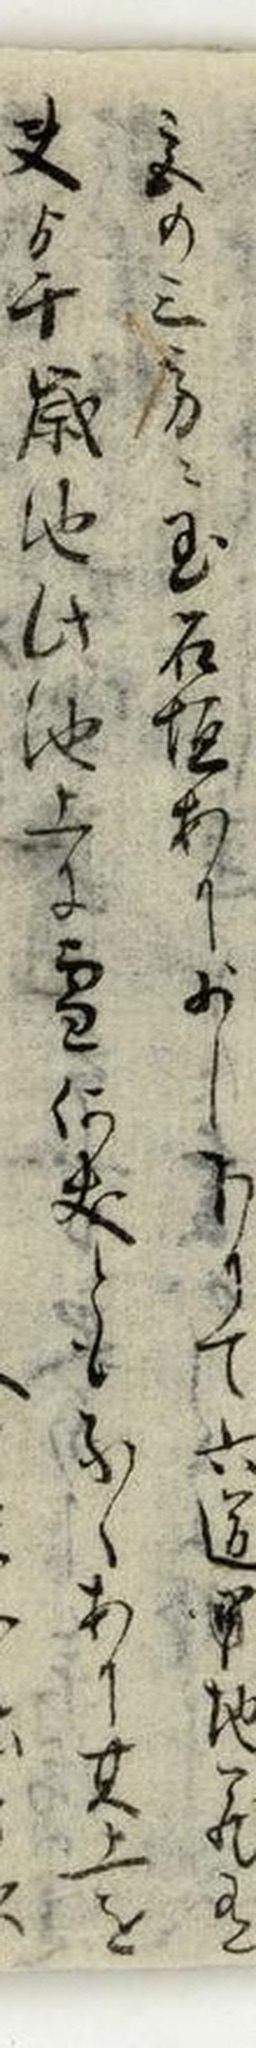夫ゟ千歳池此池上に雪何丈ともなくあり其上を
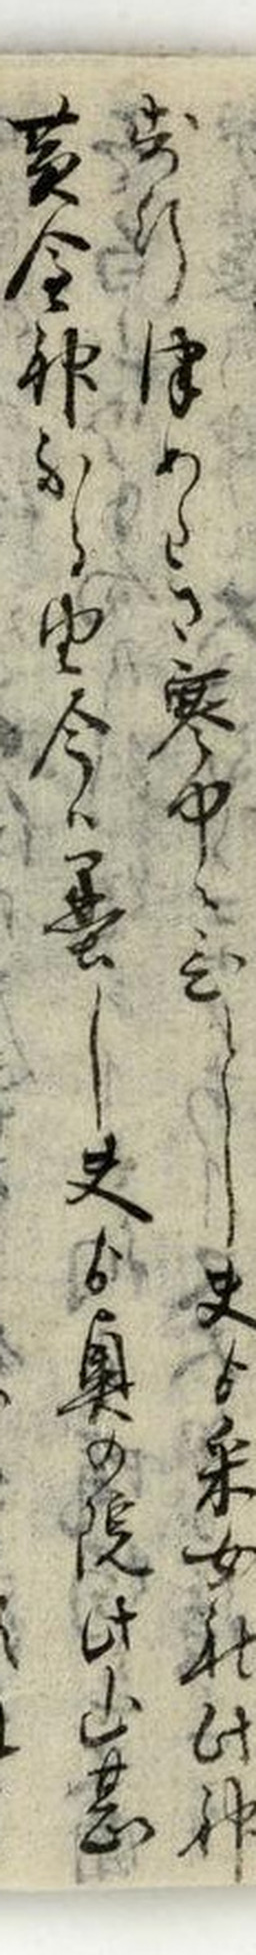黄金神なる由今ハ墨し夫ゟ奥の院此山甚
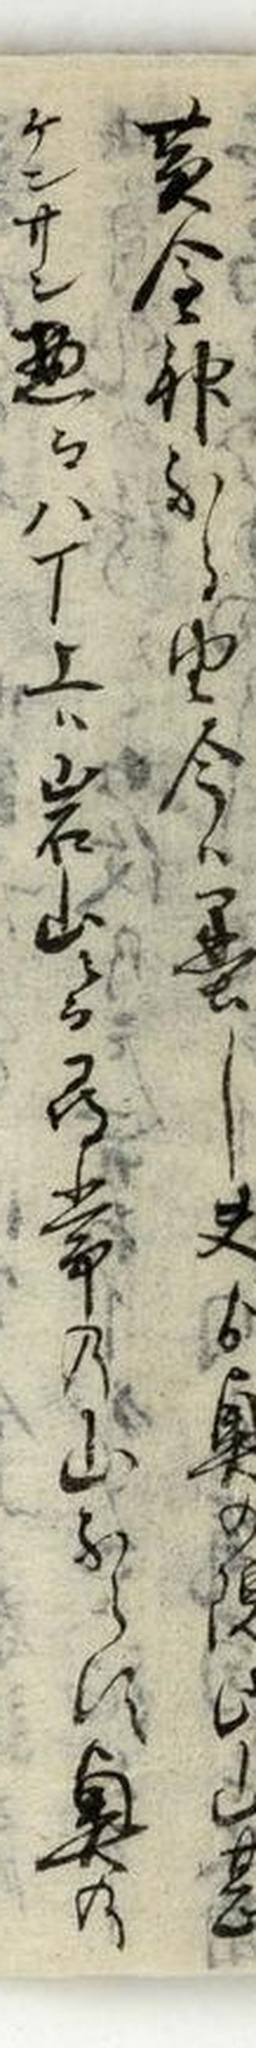ケンサン惣而八丁ウエハ岩山ニ而尋常乃山なら須奥乃
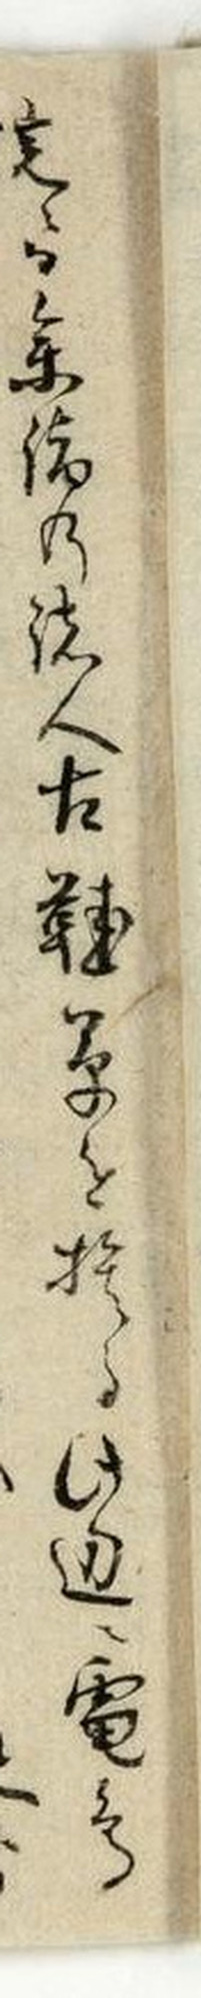院ニ而参詣乃諸人古鞋草を捨る此辺ニ雷鳥
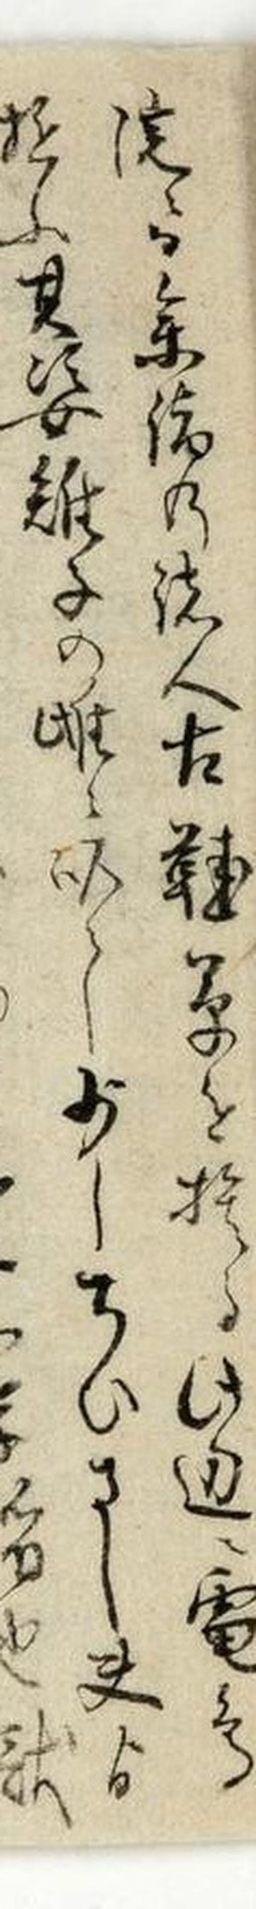遊ふ其姿雉子の雌ニ少しちいさし夫ゟ
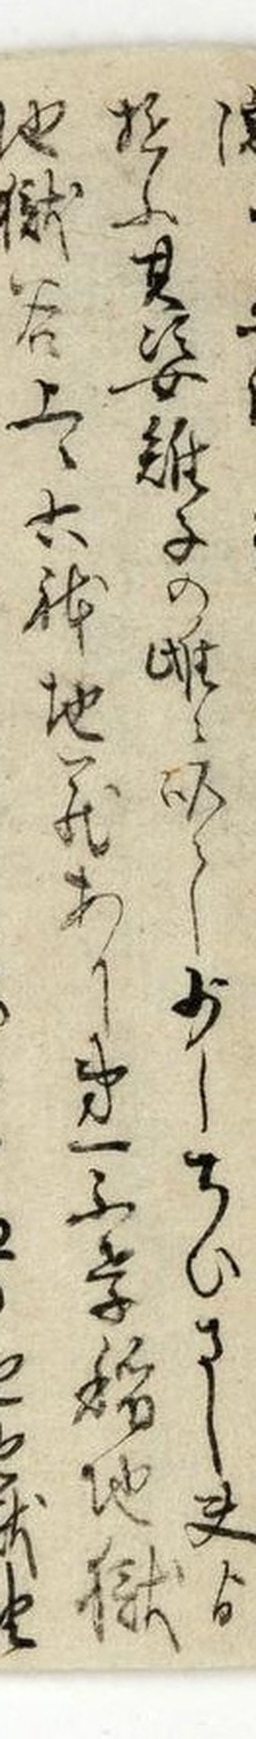地獄谷上へ六体地蔵あり専一不稲地獄
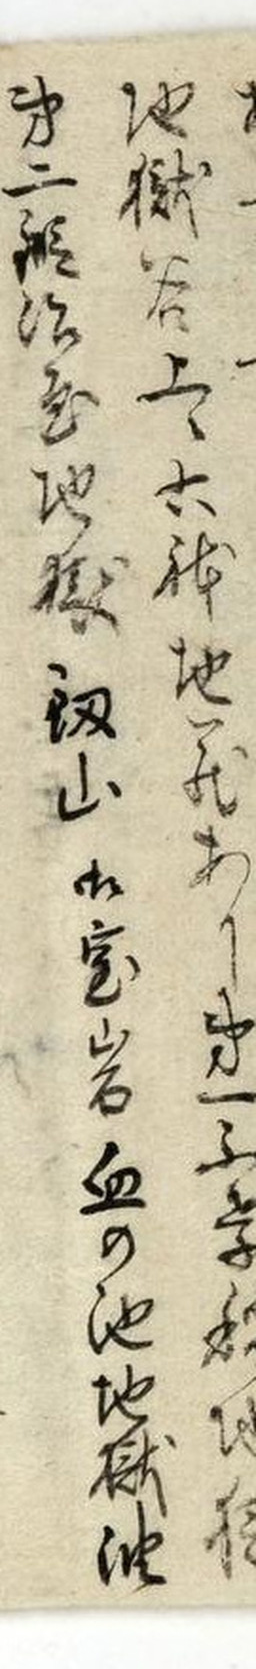第二鍛冶屋地獄剣山御室岩血の池地獄油
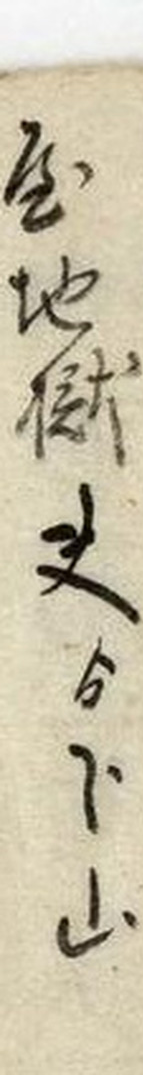屋地獄夫ゟ下山
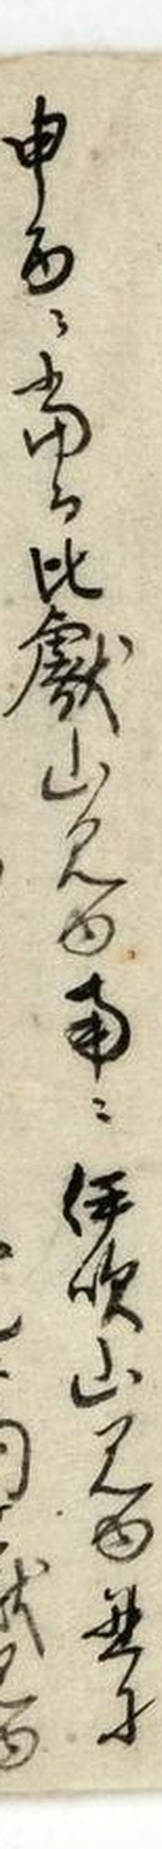申丙ニ当る比叡山見ゆ南に伊吹山見ゆ北
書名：白山道中名所筆記（旅日記）
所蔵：福井県文書館 Fukui Prefectural Archives
